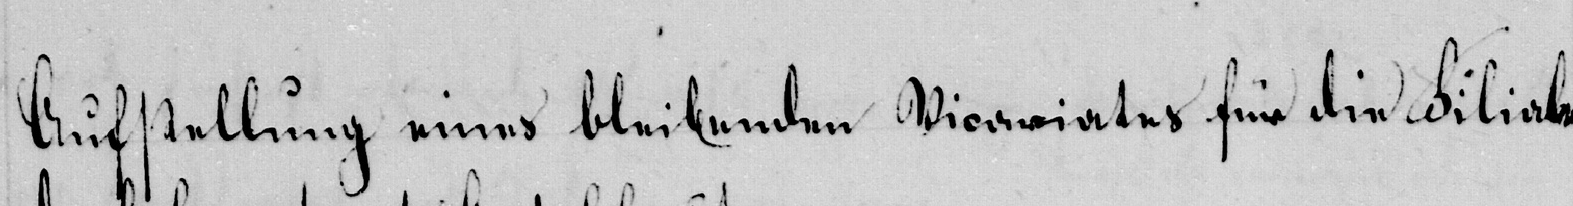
Aufstellung eines bleibenden Vicariates für die Filiale
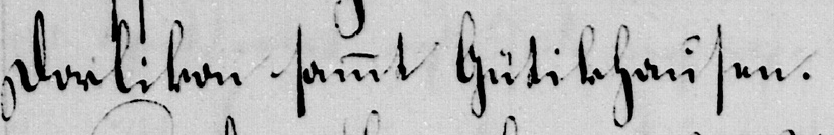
Dorlikon sammt Gütikhausen.
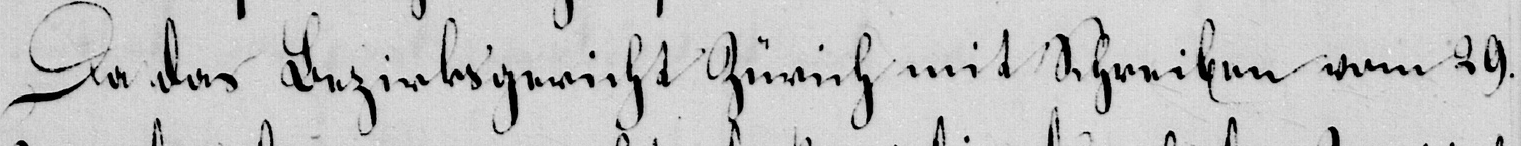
Da das Bezirksgericht Zürich mit Schreiben vom 29.
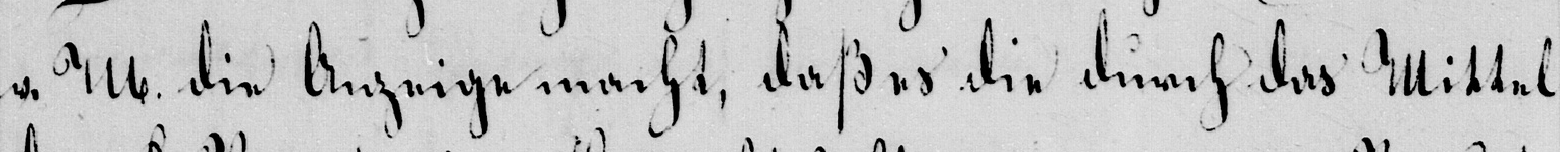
v. M. die Anzeige macht, daß es die durch das Mittel
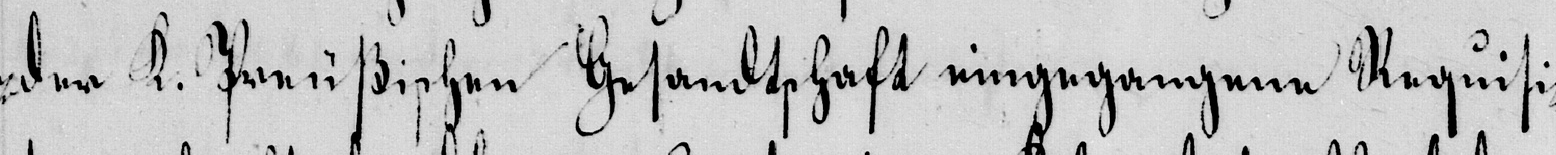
der K. Preußischen Gesandtschaft eingegangene Requisi¬
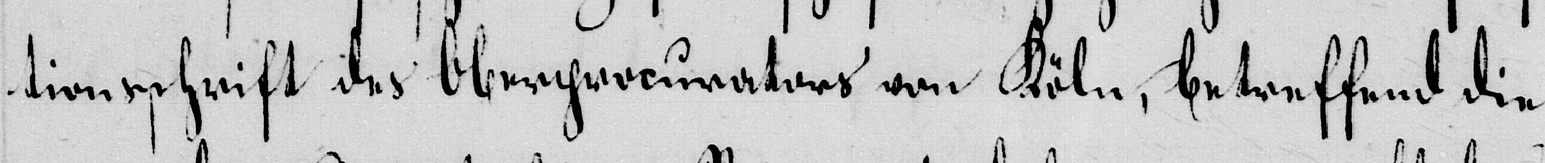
tionsschrift des Oberprocurators von Köln, betreffend die
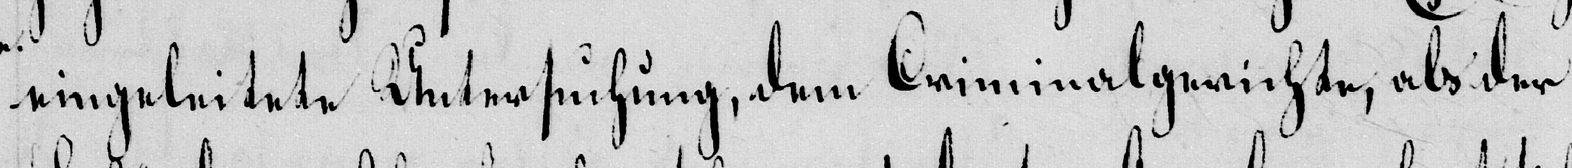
eingeleitete Untersuchung, dem Criminalgerichte, als der
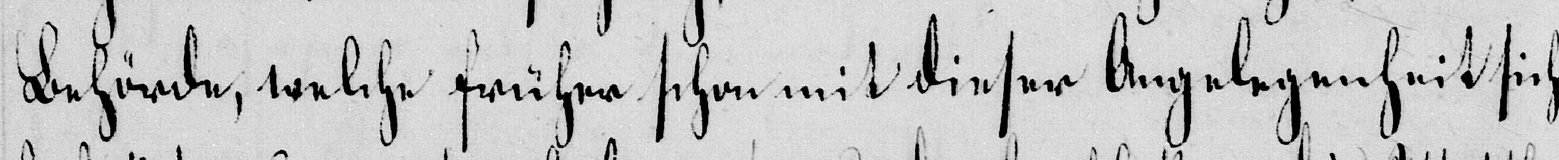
Behörde, welche früher schon mit dieser Angelegenheit sich
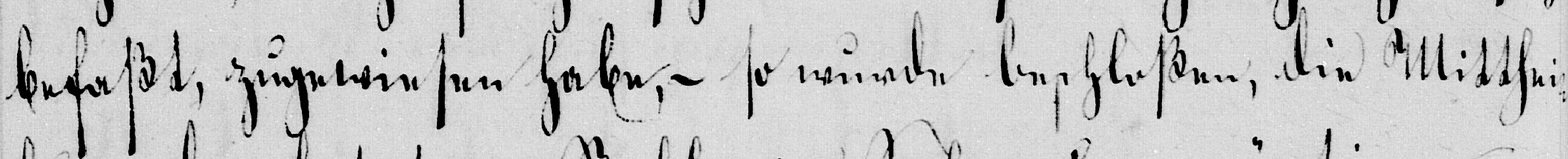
befaßt, zugewiesen habe, – so wurde beschloßen, die Mitthei¬
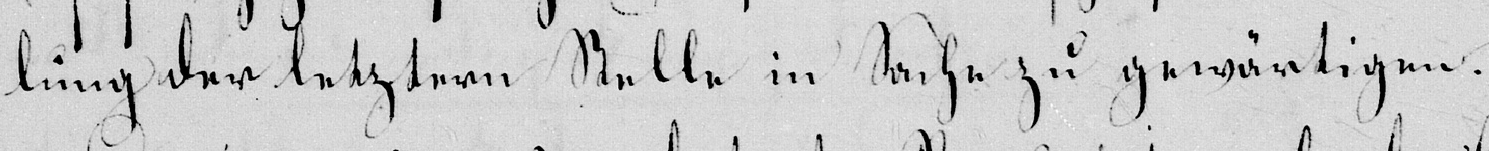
lung der letztern Stelle in Sache zu gewärtigen.
